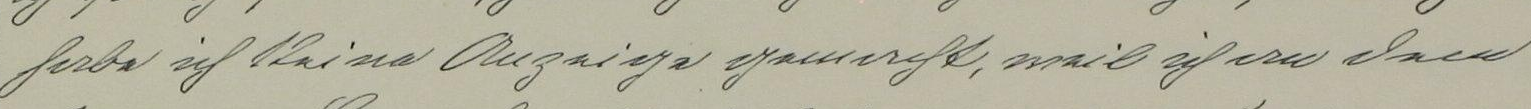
habe ich keine Anzeige gemacht, weil ich an dem
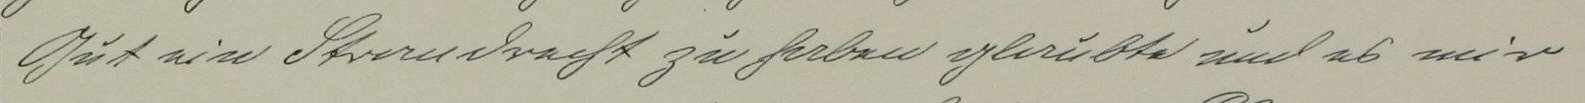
Gut ein Strandrecht zu haben glaubte und es mir
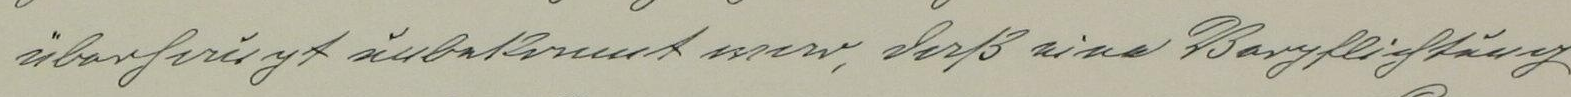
überhaupt unbekannt war, daß eine Verpflichtung
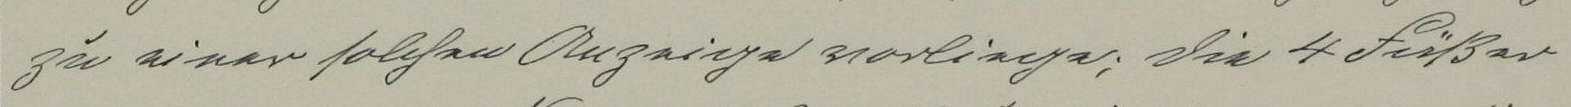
zu einer solchen Anzeige vorliege; die 4 Fäßer
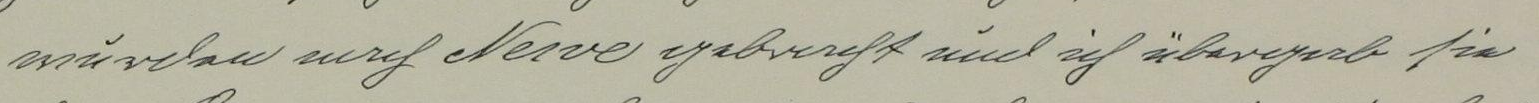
wurden nach Newe gebracht und ich übergab sie
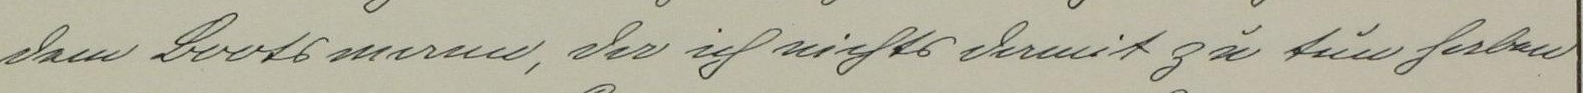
dem Bootsmann, da ich nichts damit zu tun haben
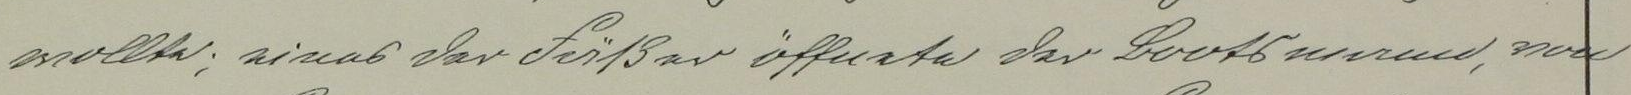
wollte; eines der Fäßer öffnete der Bootsmann, von
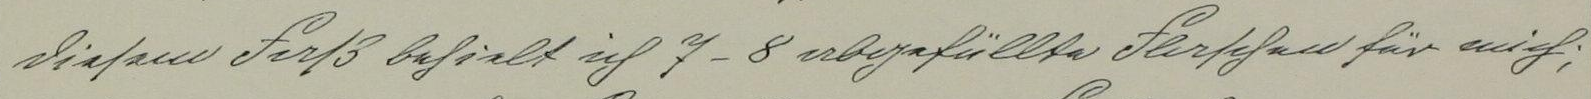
diesem Faß behielt ich 7 – 8 abgefüllte Flaschen für mich;
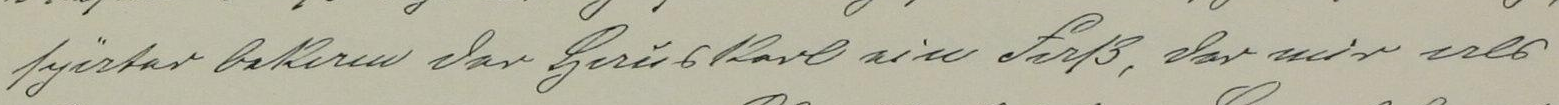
später bekam der Hauskerl ein Faß, der mir als
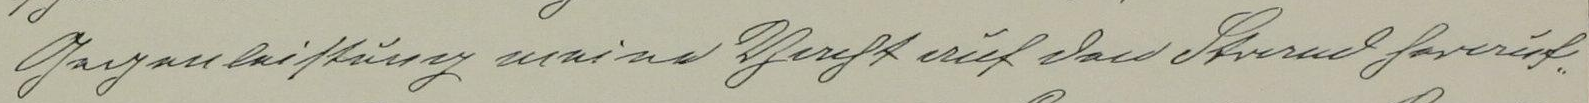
Gegenleistung meine Yacht auf den Strand herauf-
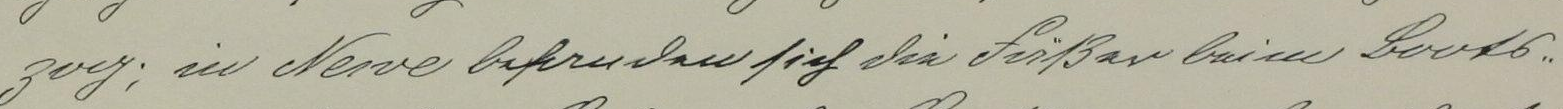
zog; in Newe befanden sich die Fässer beim Boots-
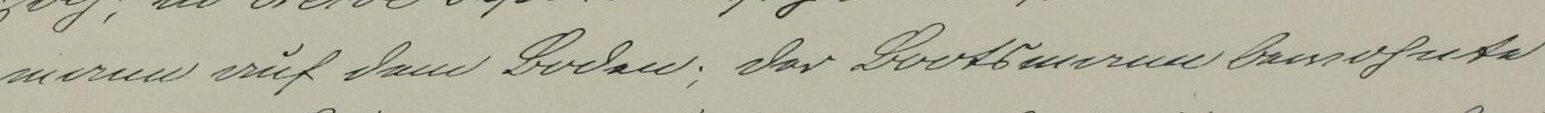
mann auf dem Boden; der Bootsmann bewohnte
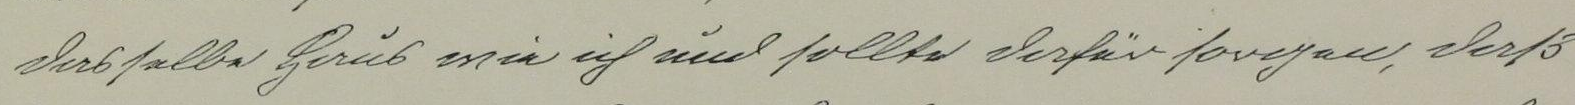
dasselbe Haus wie ich und sollte dafür sorgen, daß
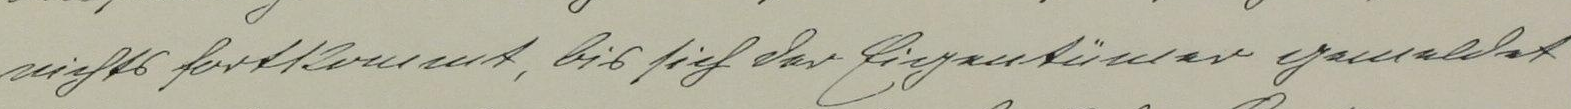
nichts fortkommt, bis sich der Eigentümer gemeldet
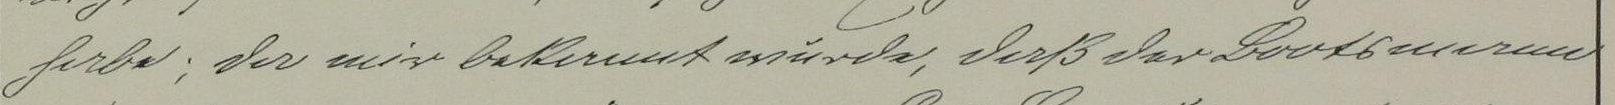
habe; da mir bekannt wurde, daß der Bootsmann
